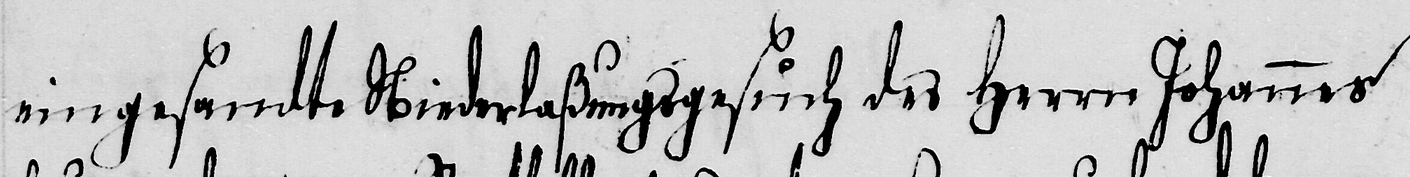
eingesandte Niederlaßungsgesuch des Herrn Johannes
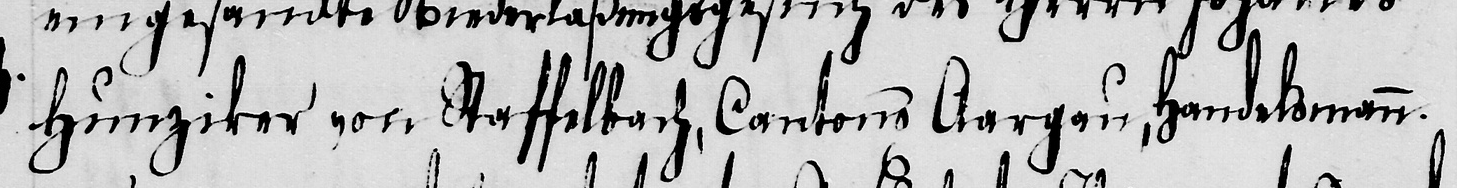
Hunziker von Staffelbach, Cantons Aargau, Handelsmann.
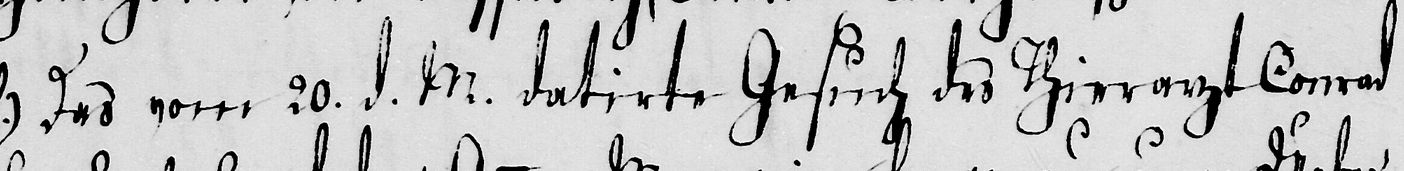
Das vom 20. d. M. datirte Gesuch des Thierarzt Conrad
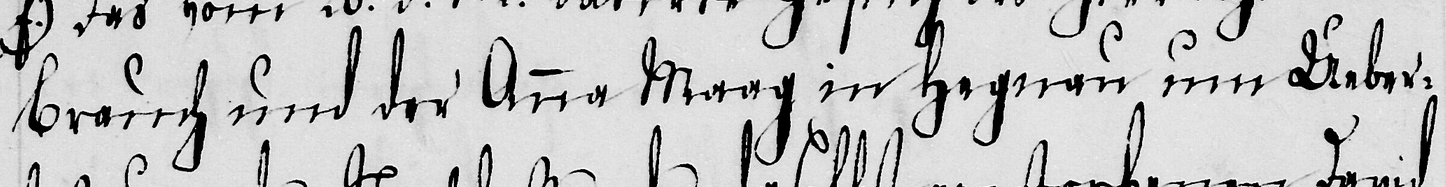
Brauch und der Anna Maag in Hegnau um Ueber¬
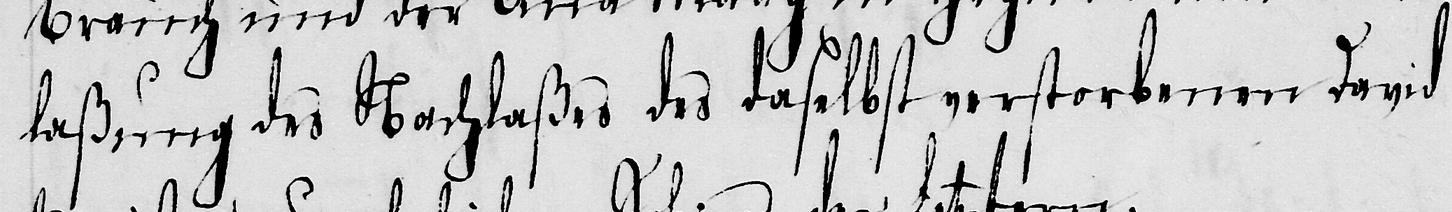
laßung des Nachlaßes des daselbst verstorbenen David
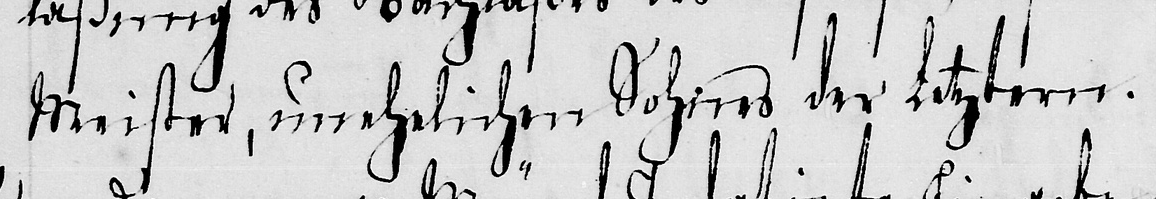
Meister, unehelichen Sohnes der Letztern.
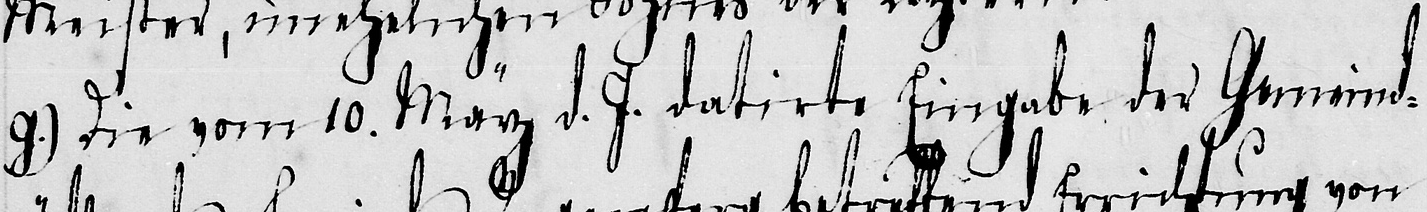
g.) Die vom 10. März d. J. datirte Eingabe der Gemeind¬
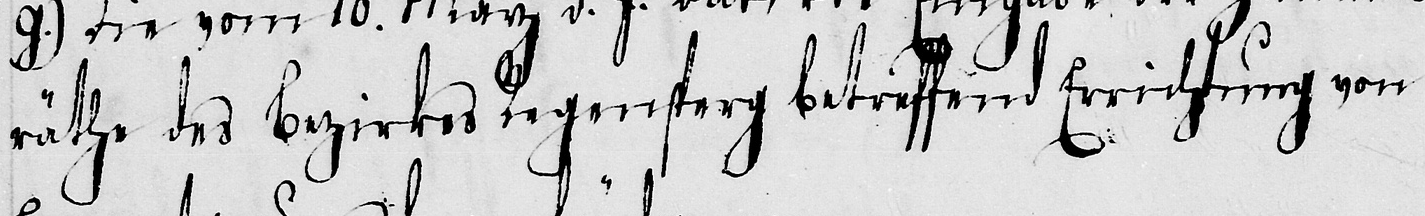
räthe des Bezirkes Regensperg betreffend Errichtung von
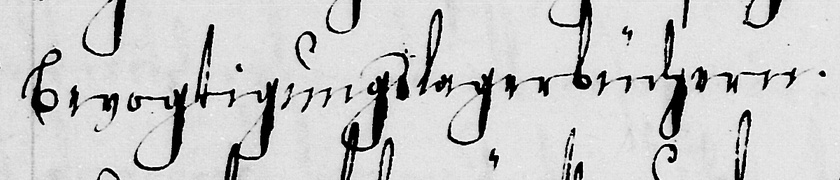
Bevogtigungslagerbüchern.
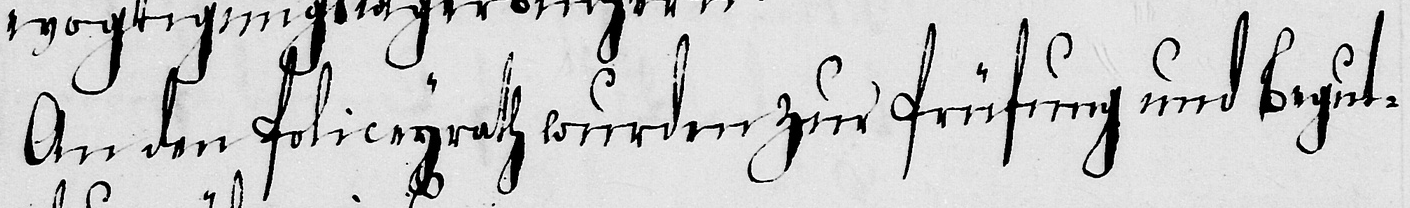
An den Policeyrath wurden zur Prüfung und Begut¬
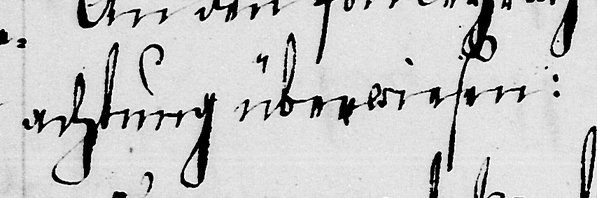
achtung überwiesen:
